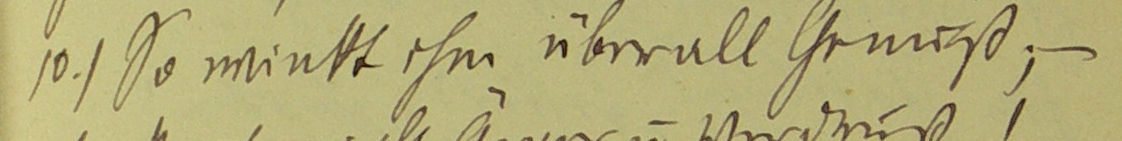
10) So winkt ihm überall Genuß, -
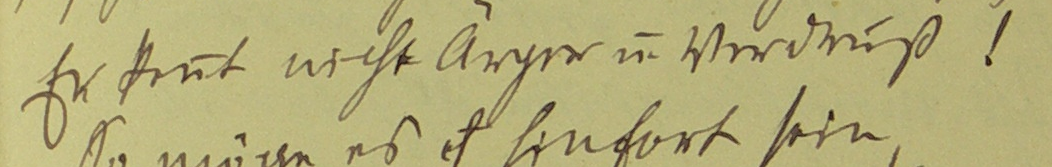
Er kent nicht Ärger u. Verdruß !
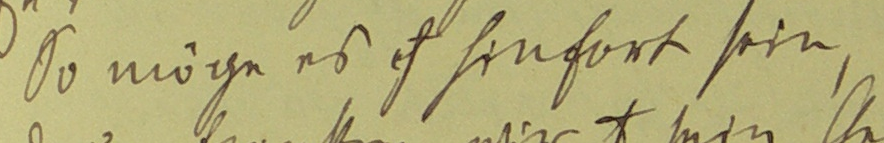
So möge es auch hinfort sein,
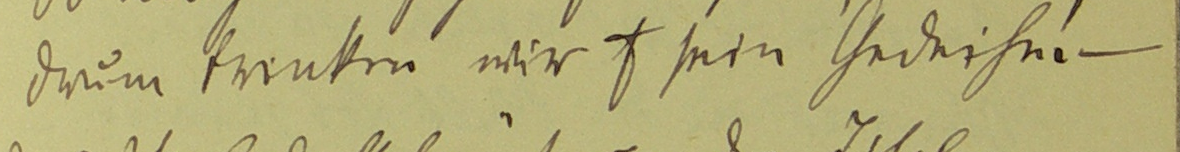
Drum trinken wir auf sein Gedeihen ! -
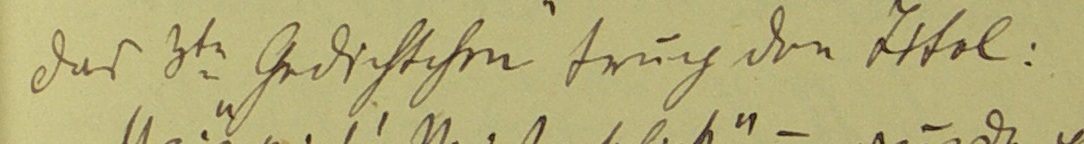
Das 3-te Gedichtchen trug den Titel :
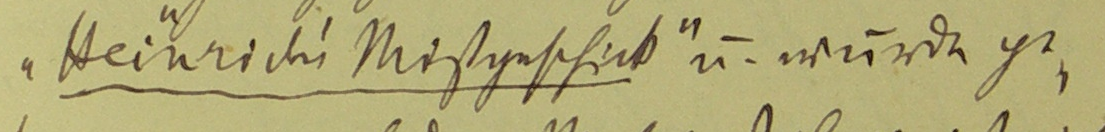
„Heinrichs Mißgeschick“ u. wurde ge¬
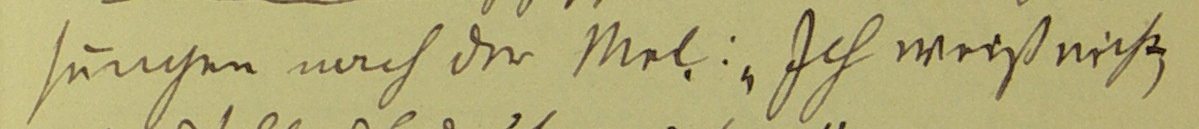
sungen nach der Mel : „ Ich weiß nicht
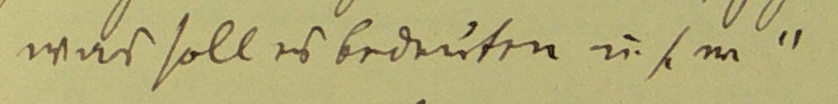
was soll das bedeuten u.s.w.“
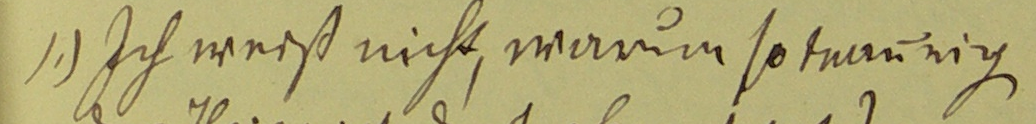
1) Ich weiß nicht, warum so traurig
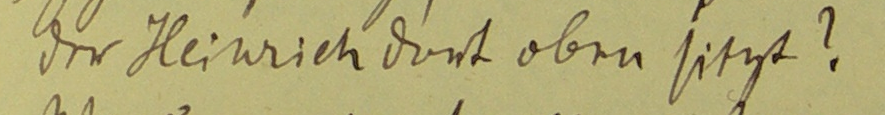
der Heinrich dort oben sitzt ?
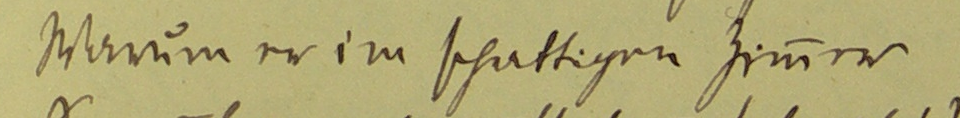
Warum er im schattigen Zimer
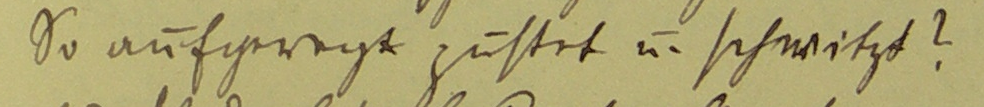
So aufgeregt zittert und schwitzt ?
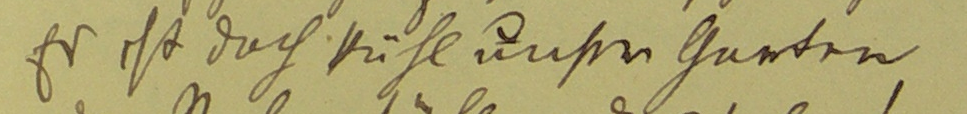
Es ist doch kühl unser Garten
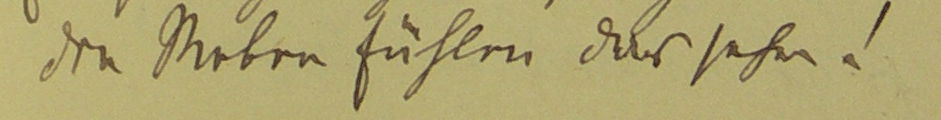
Die Reben füllen das Jahr ! -
